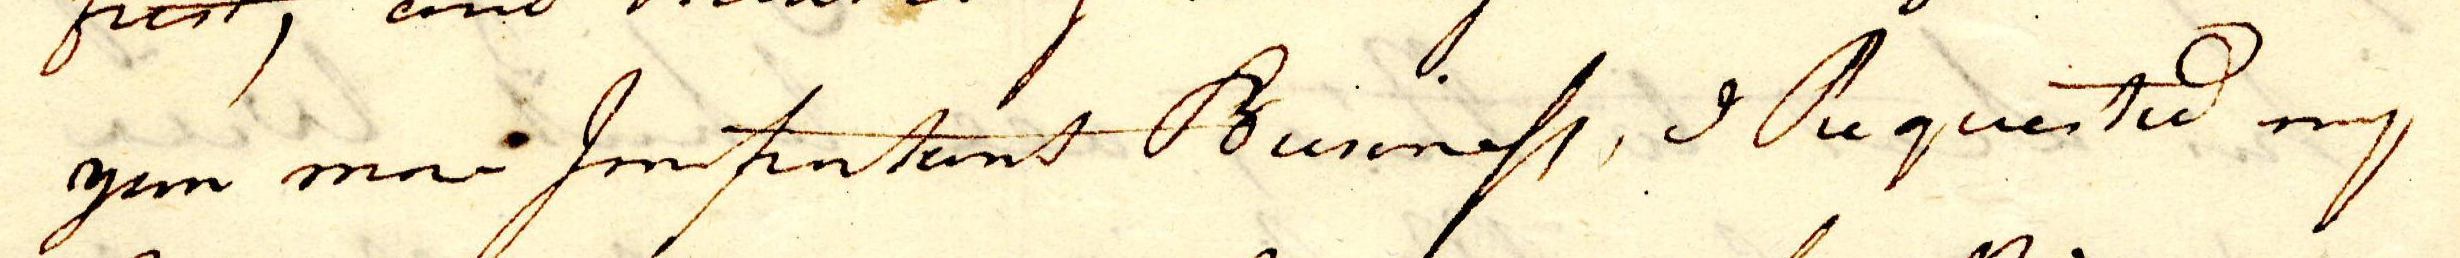your more Important Business, I Requested my
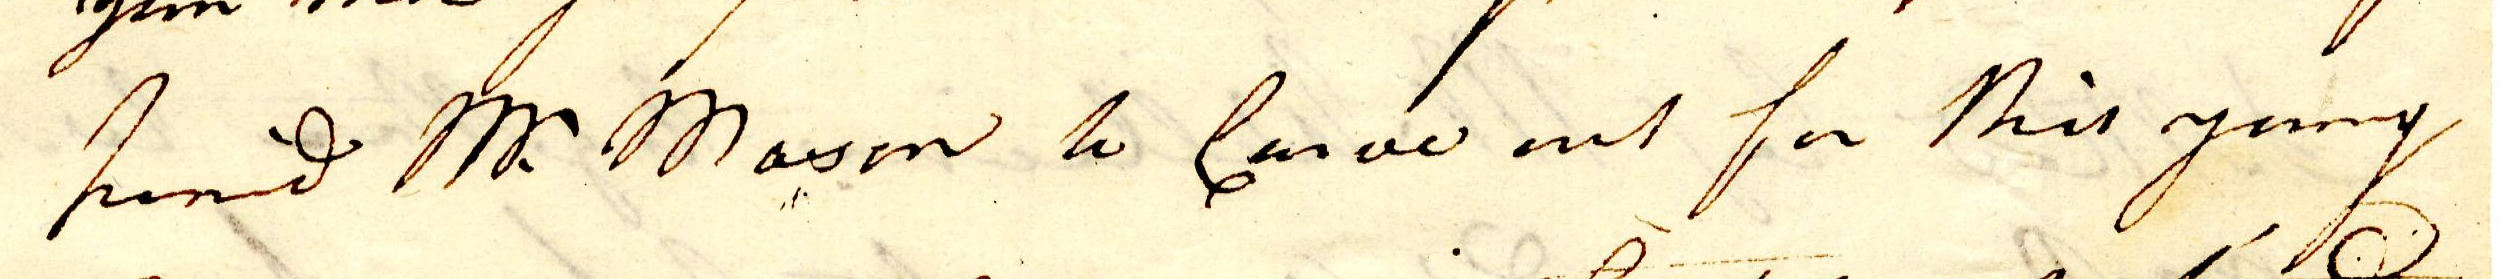friend M^r. Mason to Carve out for this young
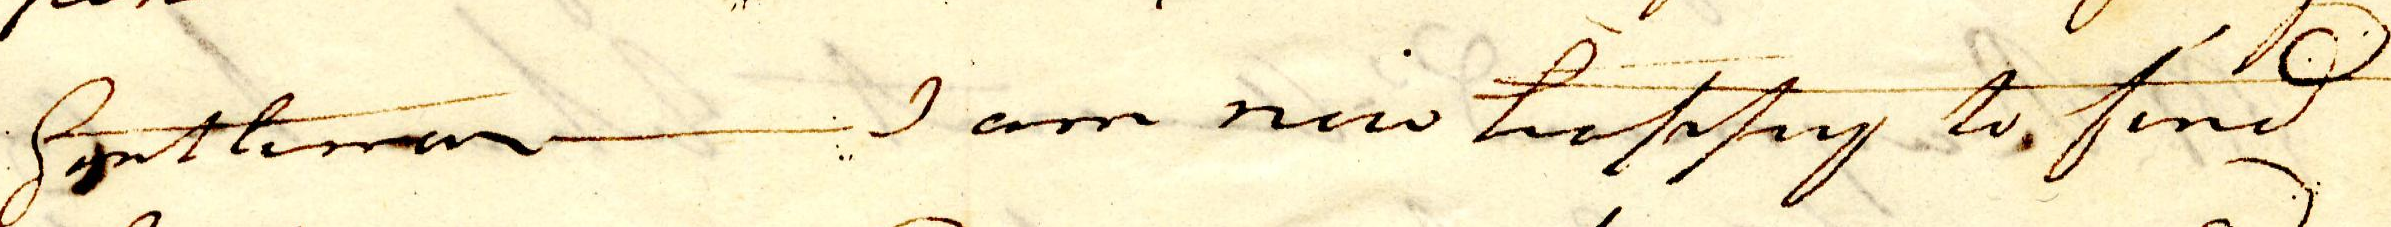Gentleman- I am now happy to find
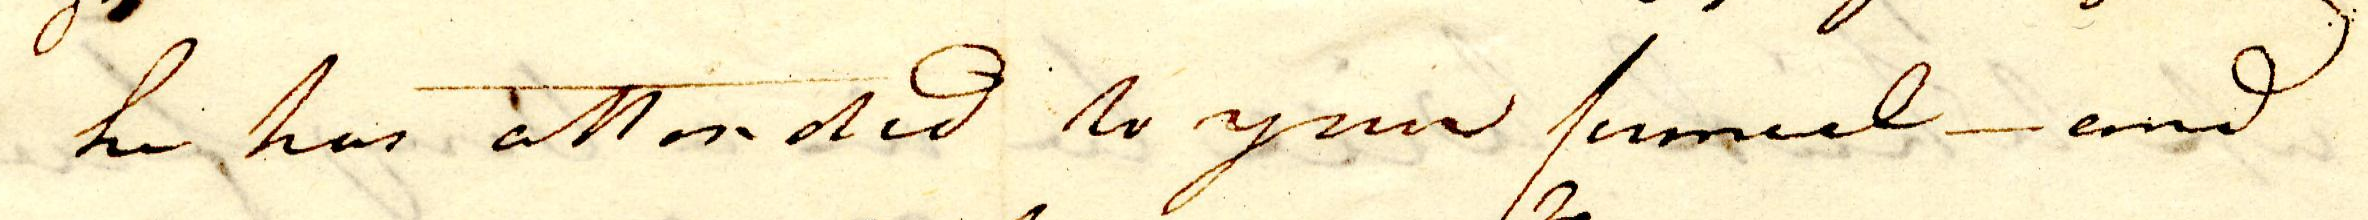he has attended to your Councel- and
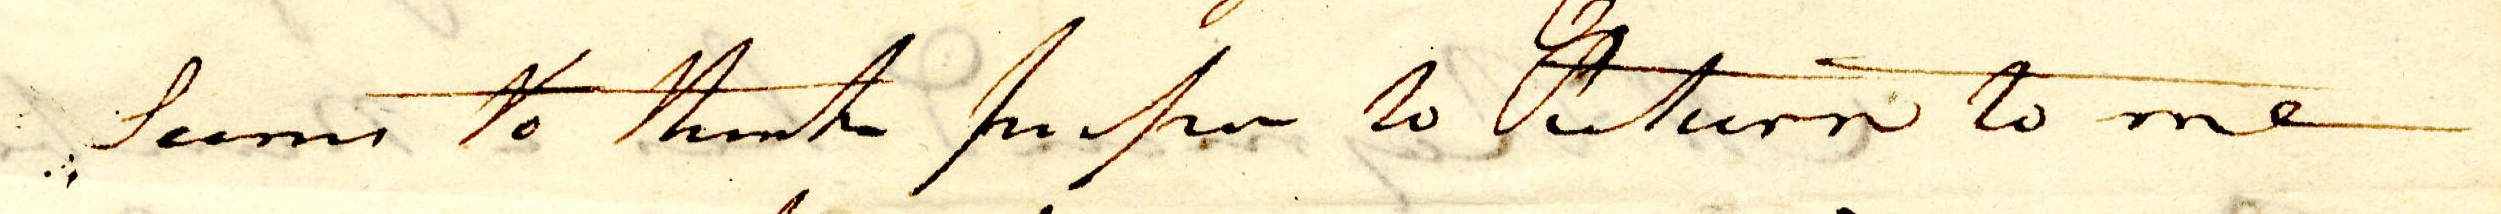seems to think proper to Return to me
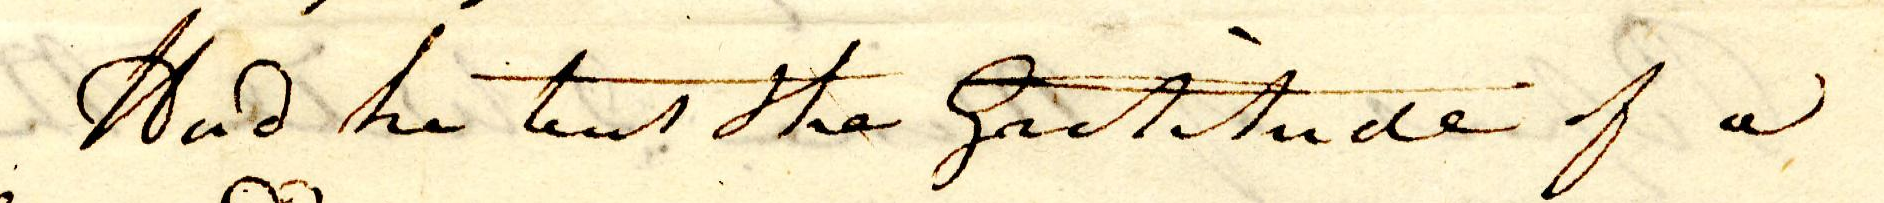Had he but the Gratitude of a
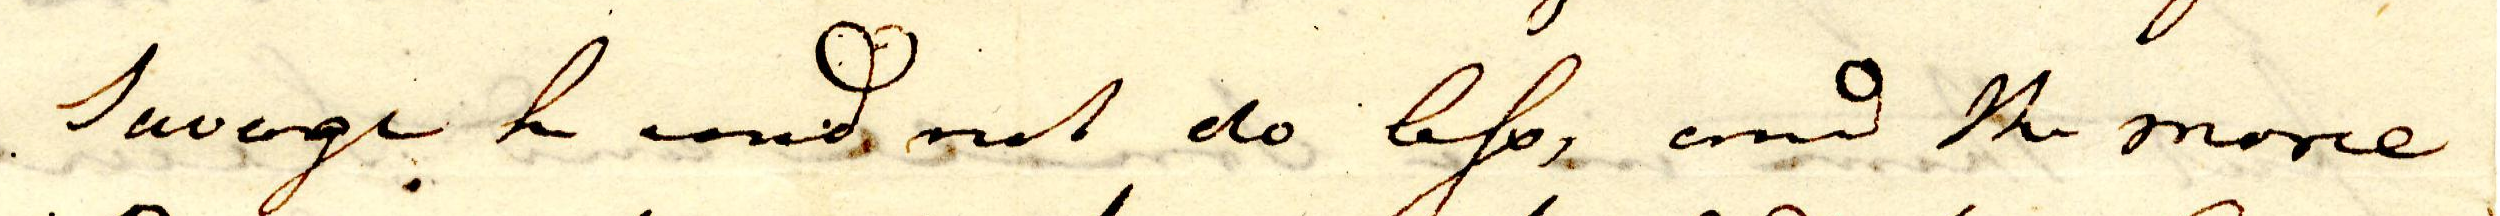Savage he could not do less, and the more
